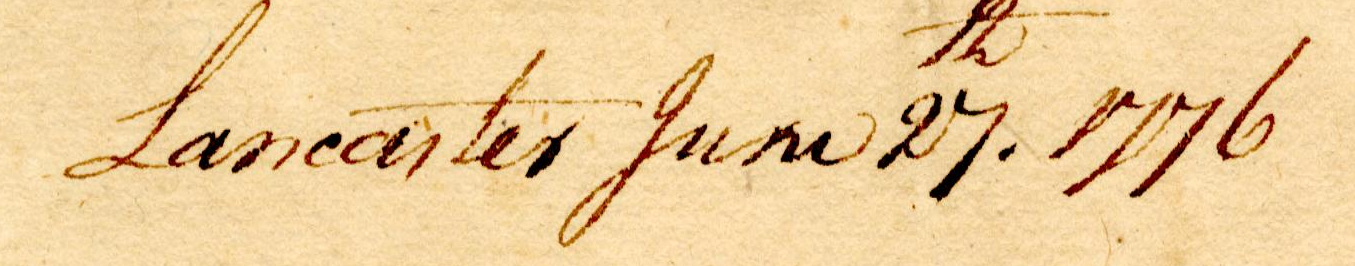Lancaster June 27^th 1776
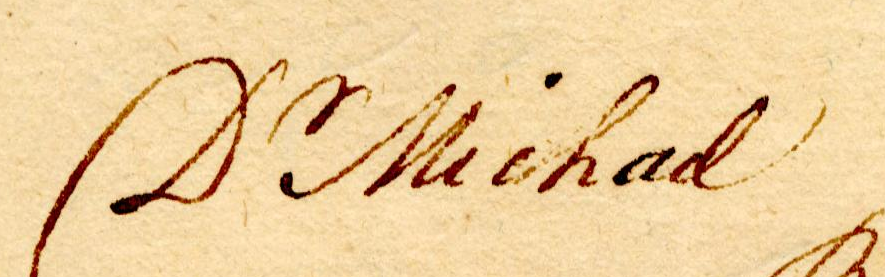D^r Michael
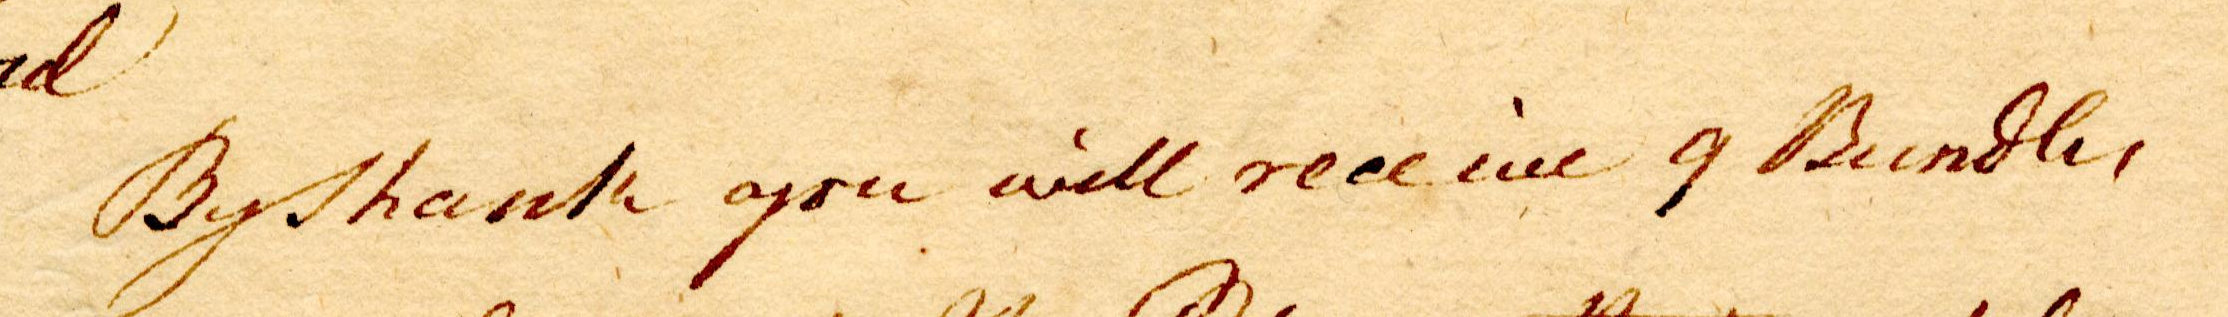By Shank you will receive 9 Bundles,
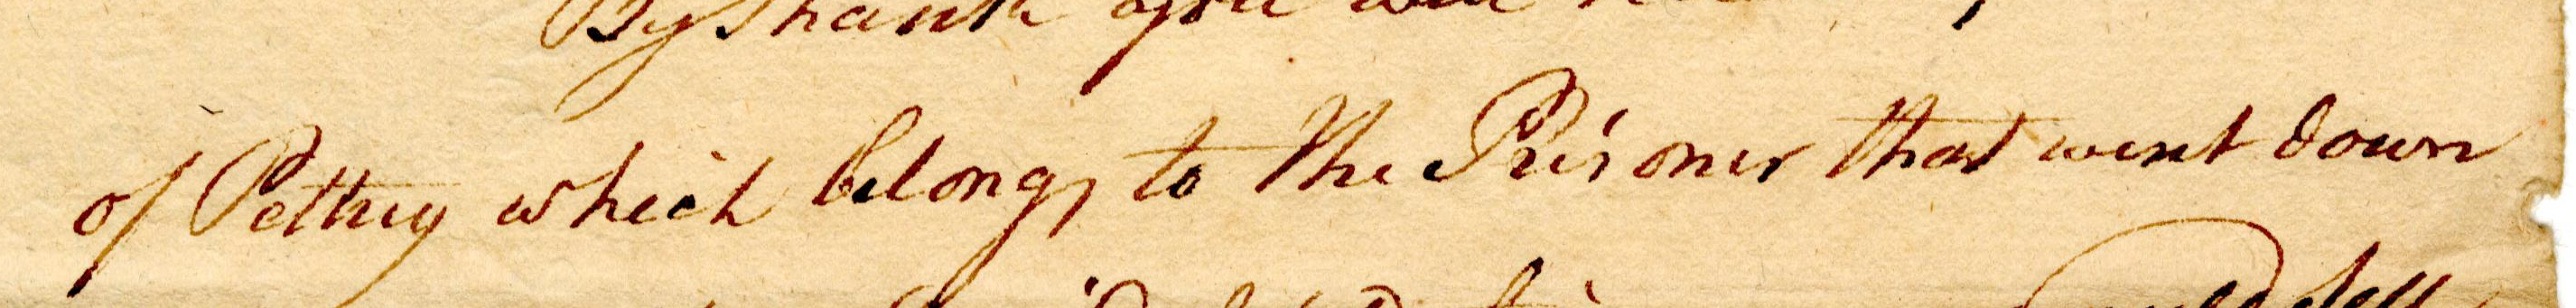of Peltry which belongs to the Prisoner that went down
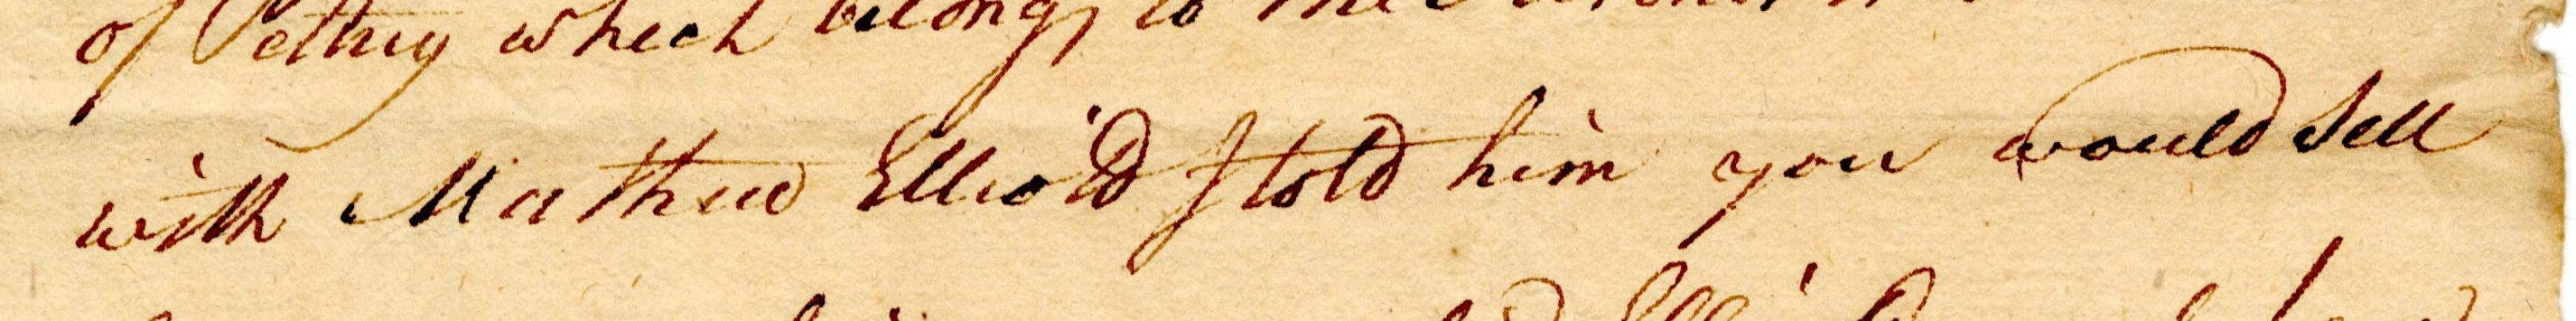with Mathew Elliotd I told him you would sell
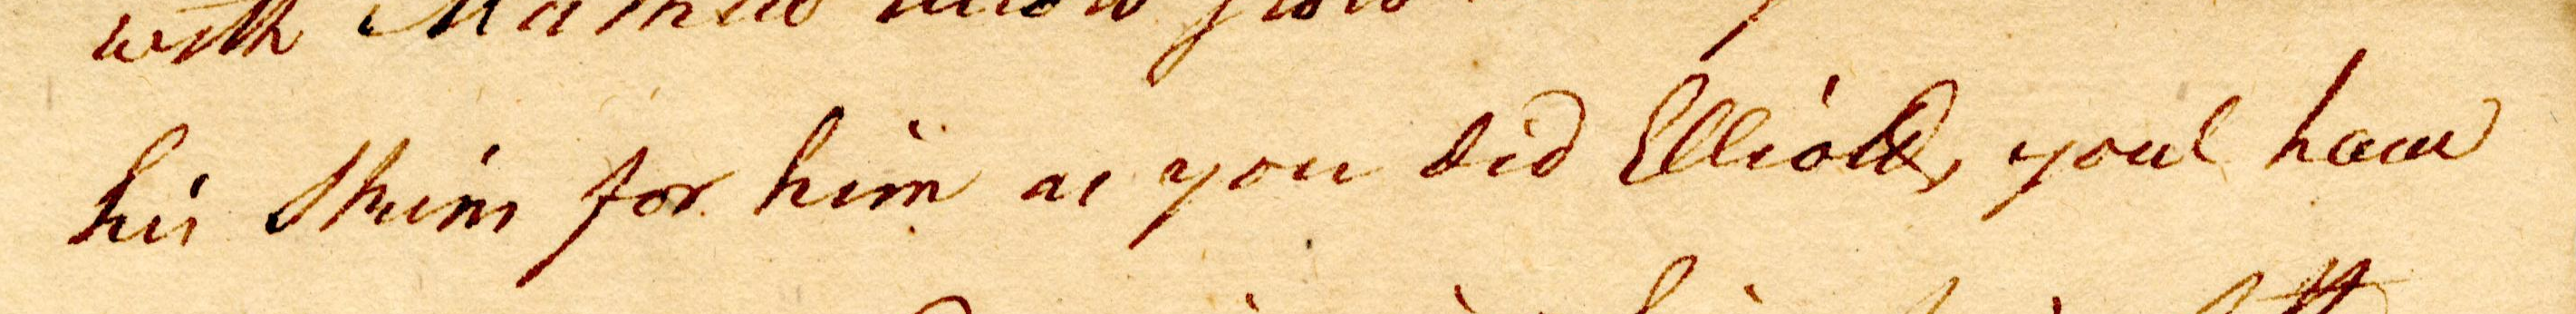his skins for him as you did Elliotd, youl have
